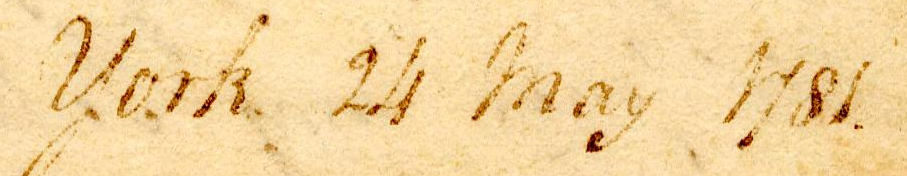York 24 May 1781
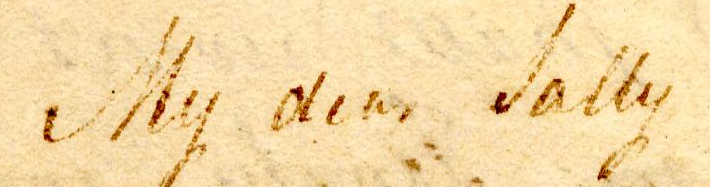My dear Sally
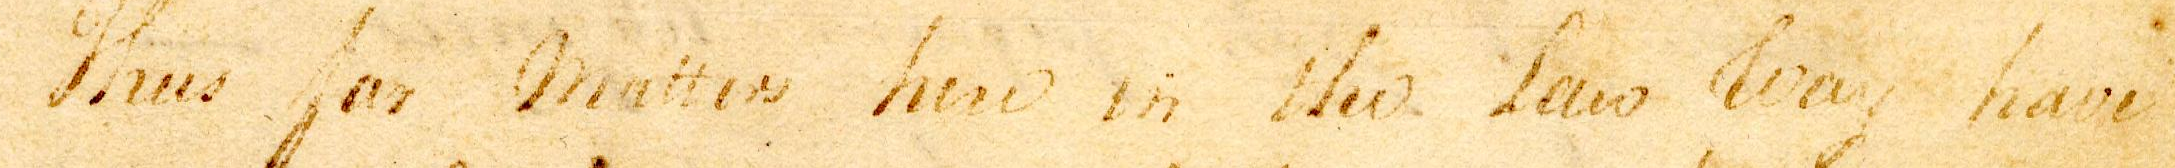Thus for Matters here in the Law way have
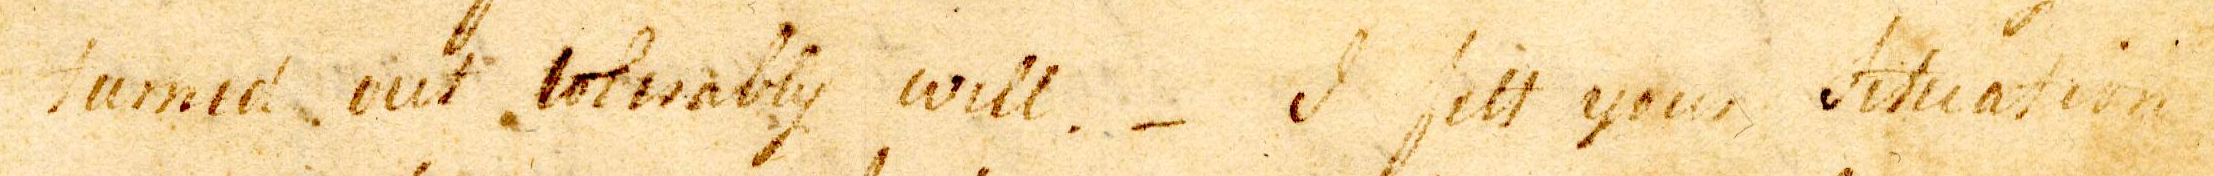turned out tolerably well- I felt your Situation
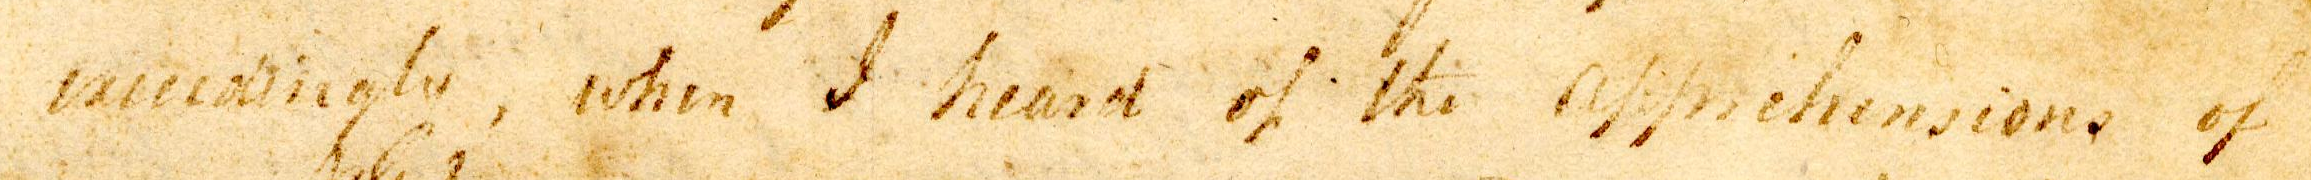exceedingly, when I heard of the Apprehensions of
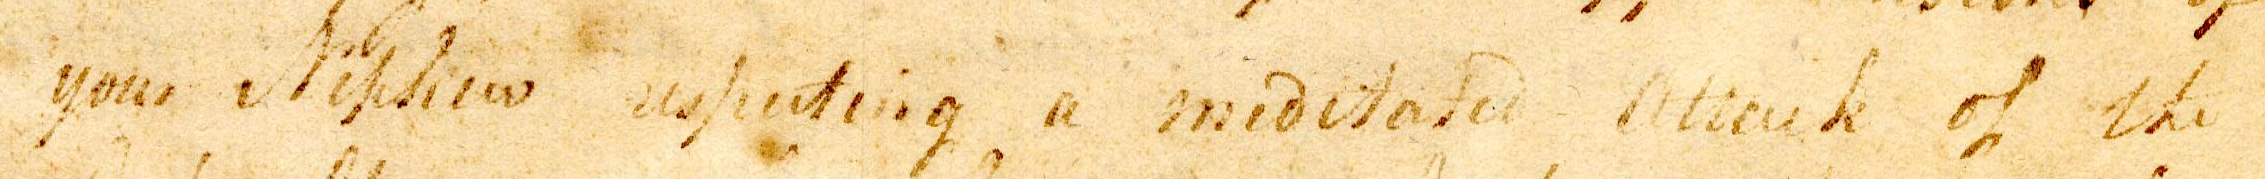your Nephew suspecting a meditated Attack of the
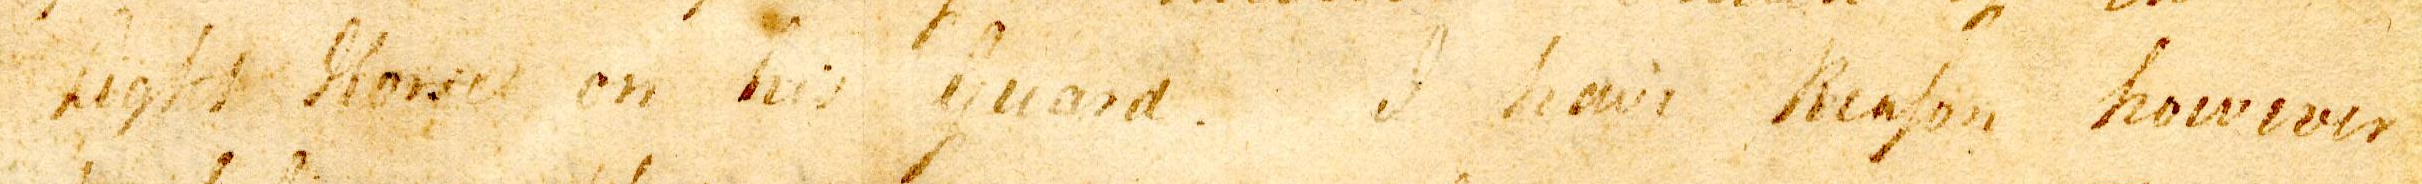Light Horse on his Guard. I have Reason however
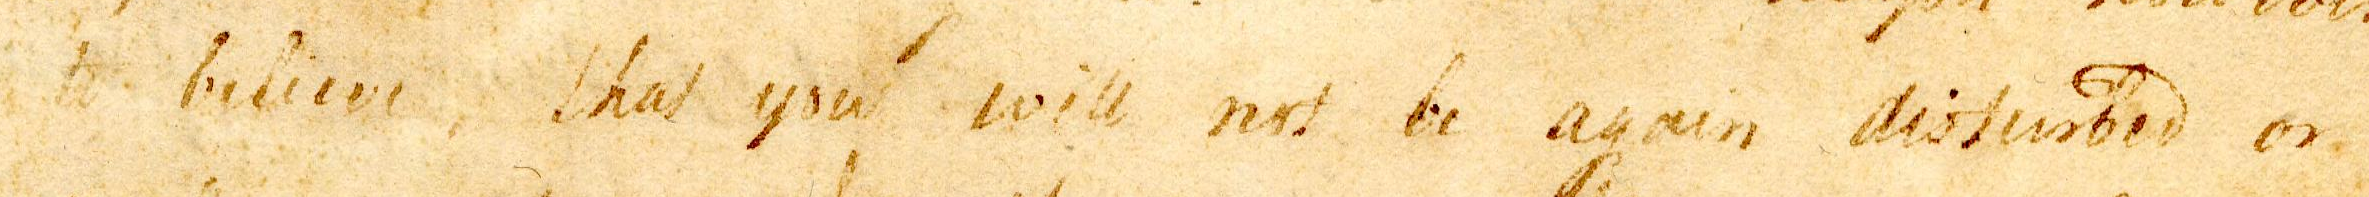to believe that you will not be again disturbed or
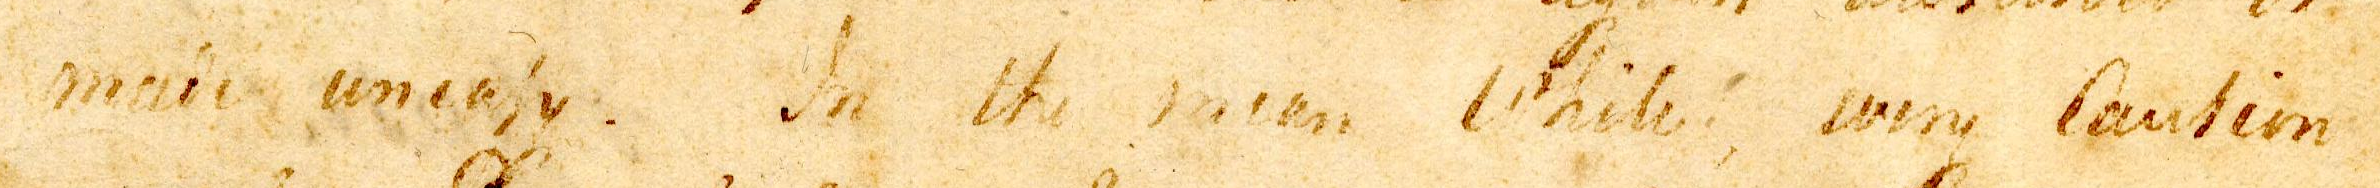made uneasy. In the mean While. every Caution
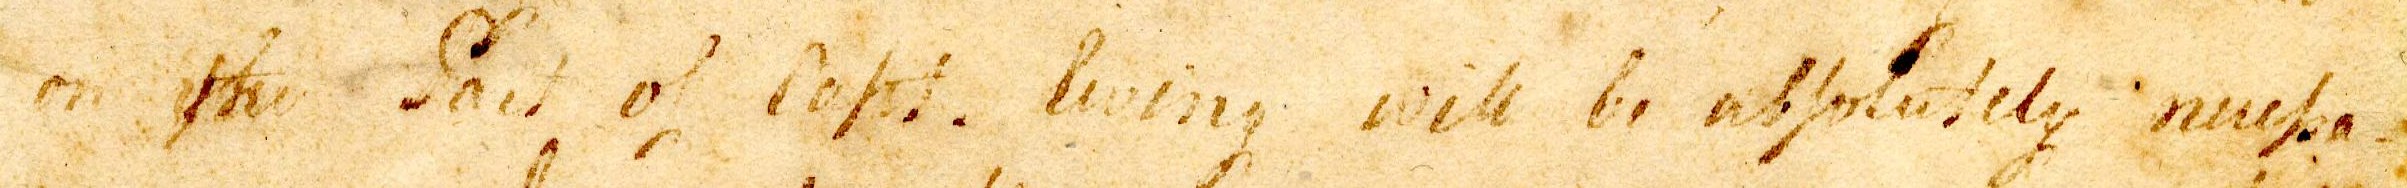on the Pact of Capt. Ewing will be absolutely necessa-
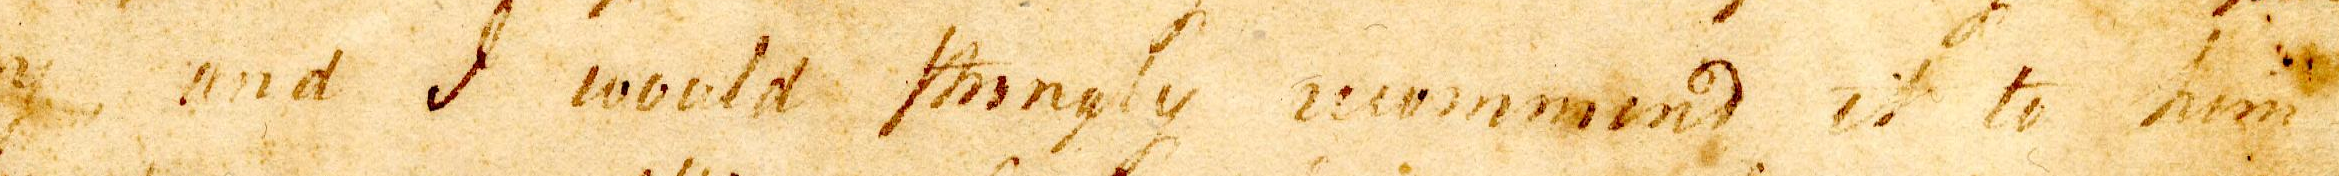-ry and I would Strongly recommend it to him
